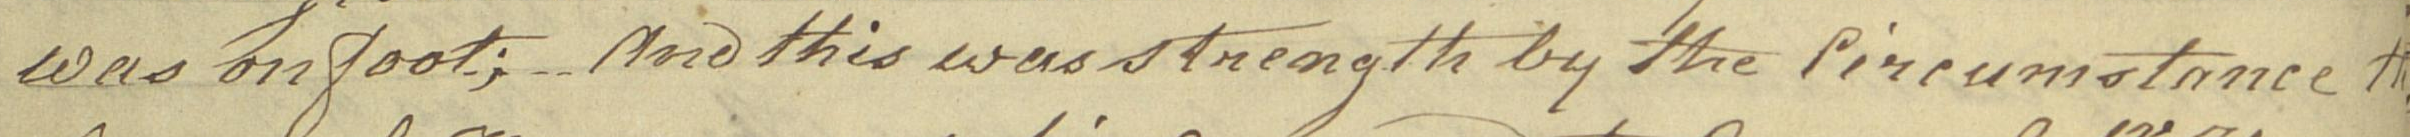was onfoot; And this was strength by the Circumstance th-
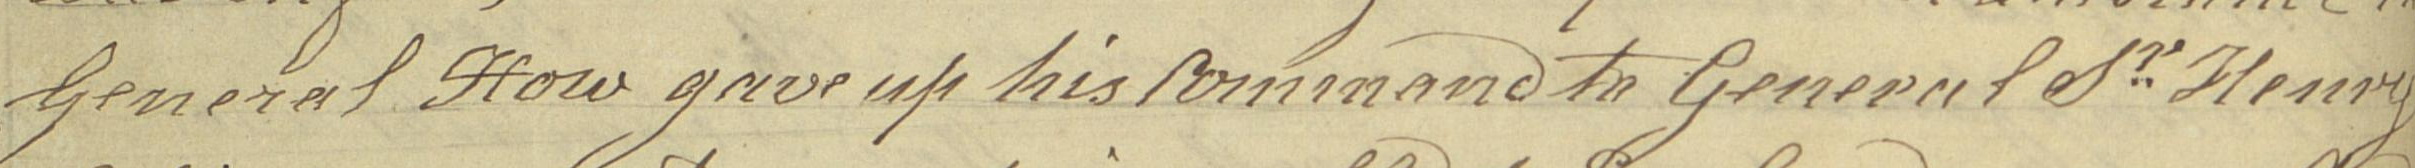General How gave up his Command to General S^r. Henry
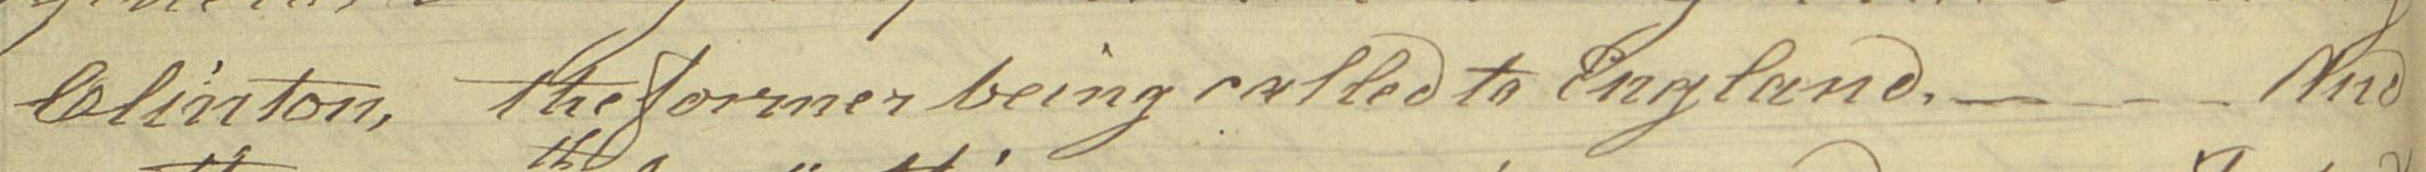Clinton, the former being called to England. And
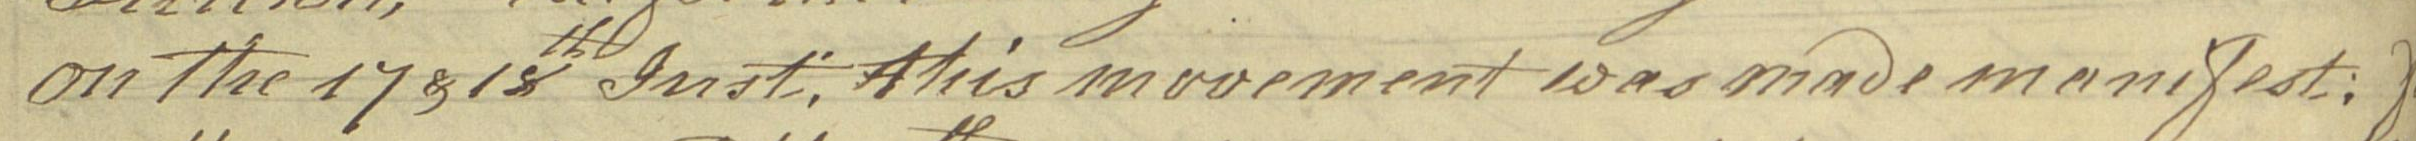on the 17 & 18^th Inst: this movement was made manifest:
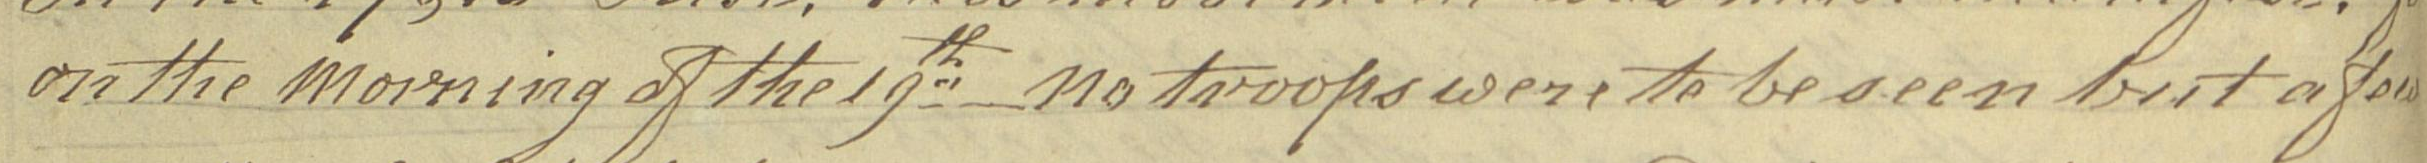on the morning of the 19^th. No troops were to be seen but a few
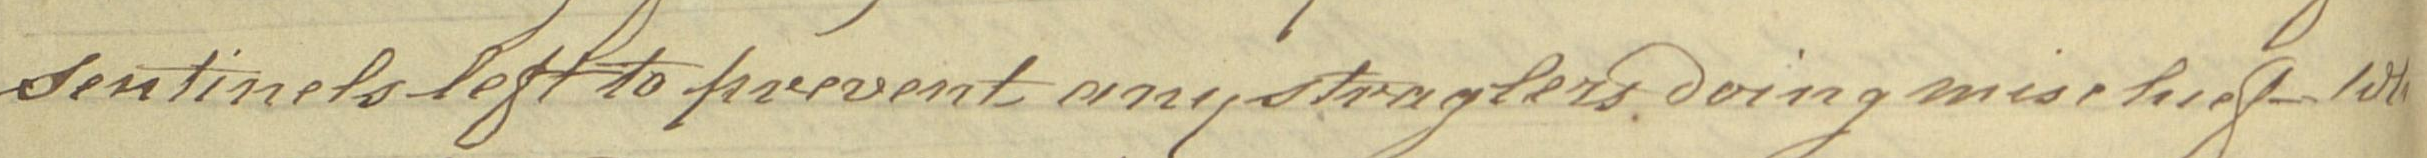sentinels left to prevent any straglers doing mischief. Wh-
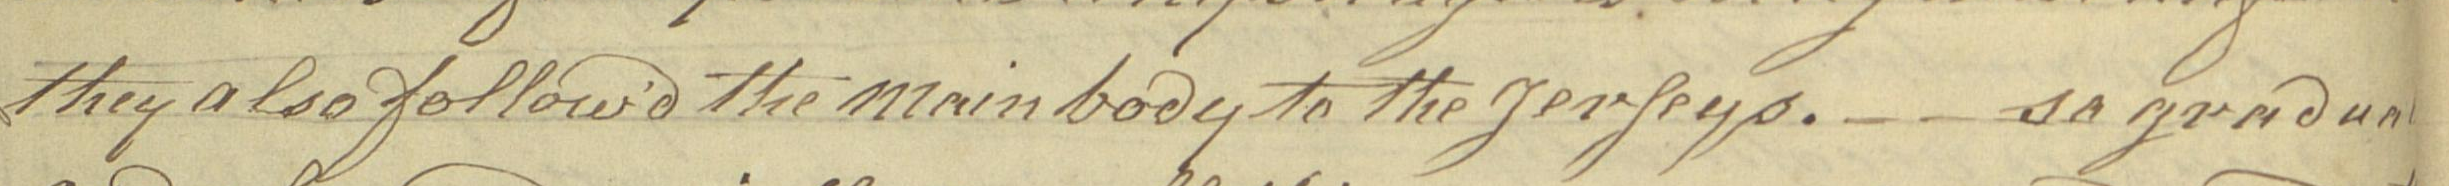they also follow'd the main body to the Jerseys. so gradual
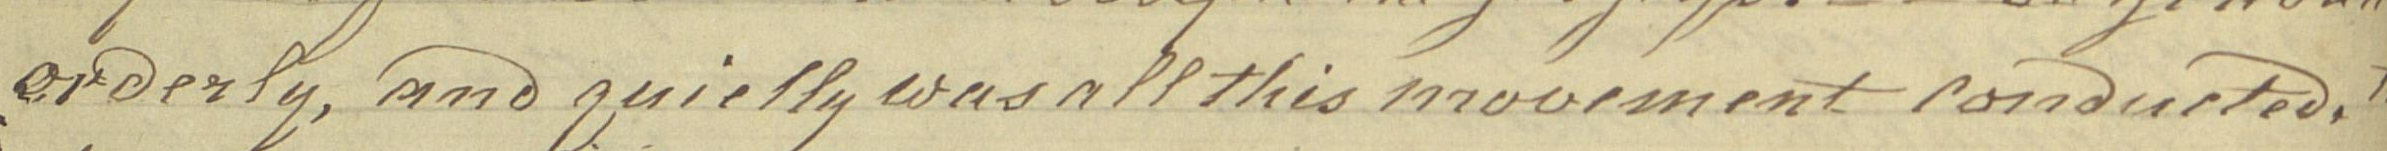orderly, and quietly was all this movement conducted.
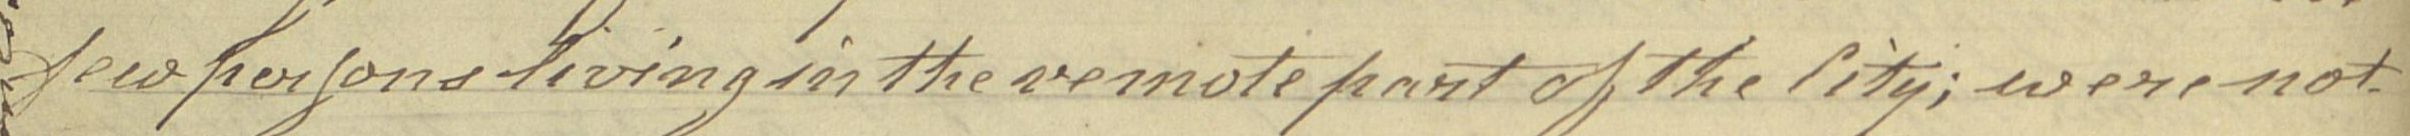few persons living in the remote part of the City; were not
